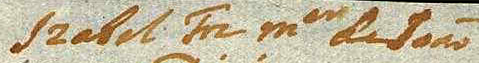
Izabel Frz mer de Ioaõ
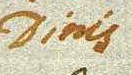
Diniz
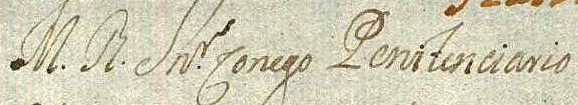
M. R. Sn.r Conego Penitenciario
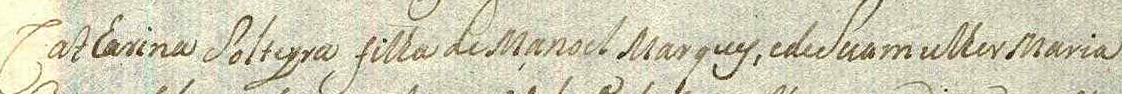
Catharina Solteyra filha de Manoel Marques, e de Sua mulher Maria
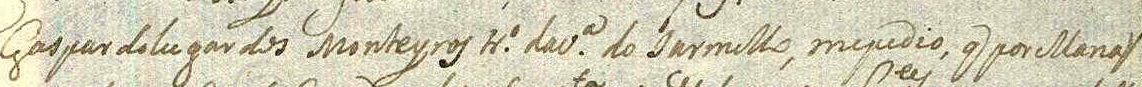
Gaspar do lugar dos Monteyros tr.o da v.a do Iarmello, me pedio, q̄ por ella naõ
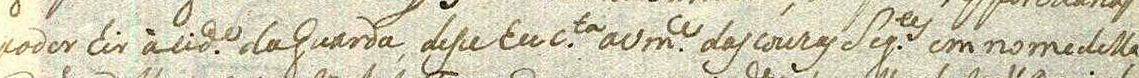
poder hir à cid.e da Guarda, desse Eu c.ta a vm.ce das couzas Seg.tes em nome della
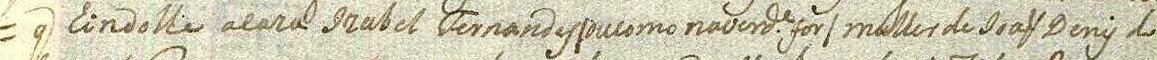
= q̄ hindolhe a caza Izabel Fernandes (ou como na verd.e for) mulher de Ioaõ Denis do
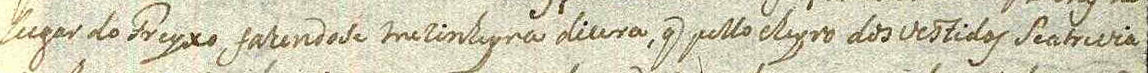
Lugar do Freyxo, fazendo-se mezinheyra dicera, q̄ pello cheyro dos vestidos Se atrevia
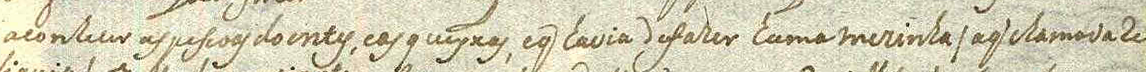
a conhecer as pessoas doentes, e as queyxas, e q̄ havia de fazer huma mezinha / a q̄ chamava Re
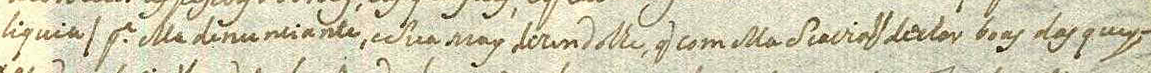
liquia/ p.a ella denunciante, e sua May dizendolhe, q̄ com ella Se aviaõ de achar boas das quey
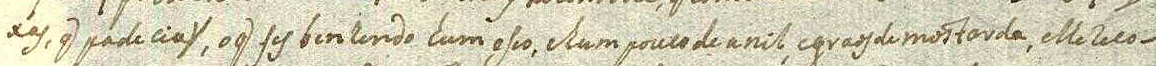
xas, q̄ padeciā, o q̄ fes benzendo hum osso, e hum pouco de anil, e graos de mostarda, e lhe Reco
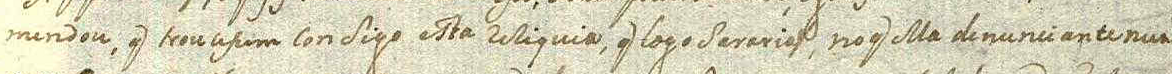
mendou, q̄ troucessem consigo esta Reliquia, q̄ logo Sarariaõ, no q̄ ella denunciante nun
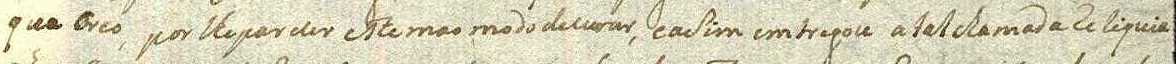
qua creo, por lhe parecer este mao modo de curar, e asim emtregou a tal chamada Reliquia
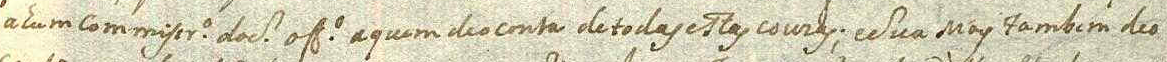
a hum Commissr.o do S.to off.o a quem deo conta de todas estas couzas; e Sua Mãy tambem deo
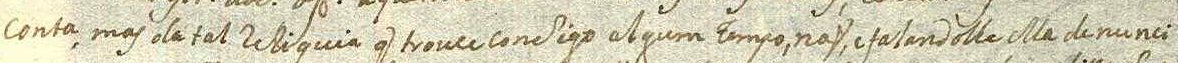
conta, mas da tal Reliquia q̄ trouce conSigo algum tempo, naõ, e falandolhe ella denunci
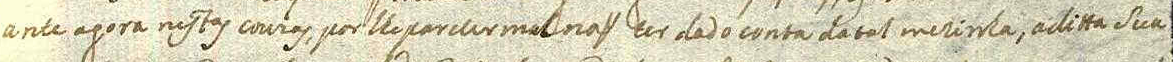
ante agora nestas couzas, por lhe parecer mal naõ ter dado conta da tal mezinha, a ditta Sua
